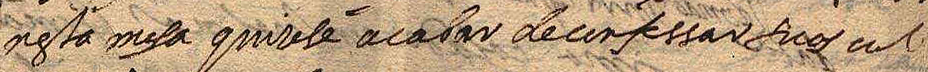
nesta mesa quizese acabar de confessar suas cul
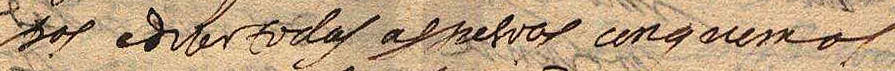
pas e dizer todas as pesoas con quem as
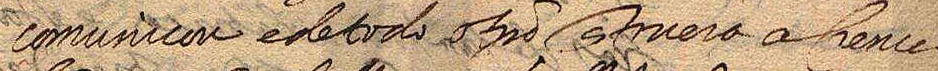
comunicou e de todo o tpō q̄ tiuera a Crença
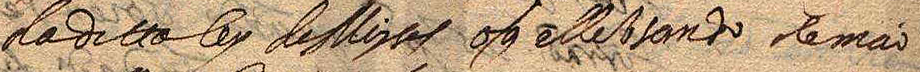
da ditta ley de Mojses o q̄ elle vsando de mao
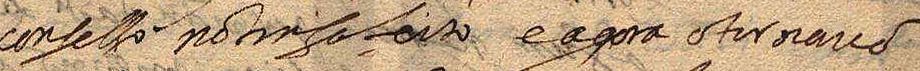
conselho nō tinha feito e agora o tornauō
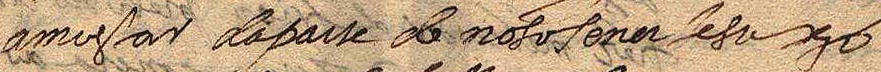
amoestar da parte de noso senhor Iesu xpō
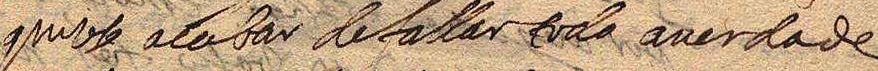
quizese acabar de fallar toda a uerdade
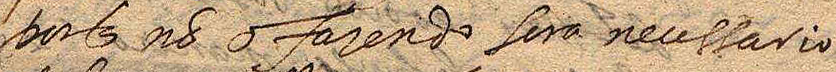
porq̄ naõ o fazendo sera necessario
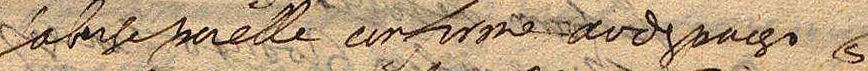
saberse por elle conforme ao despacho q̄
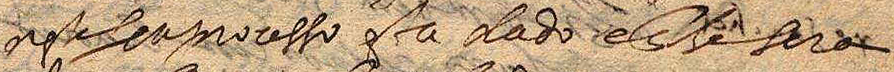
neste seu processo esta dado e q̄ he sera
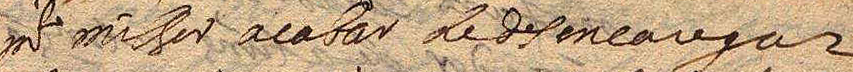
mto milhor acabar de desencaregar
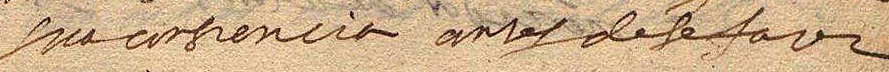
sua consiencia antes de se fazer
